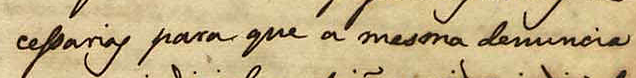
cessarias para que a mesma denuncia
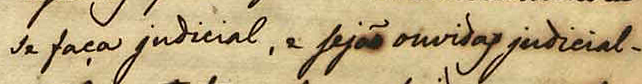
se faça judicial, e sejaõ ouvidas judicial
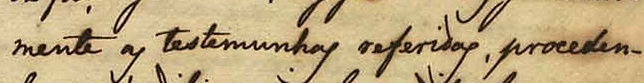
mente as testemunhas referidas, proceden
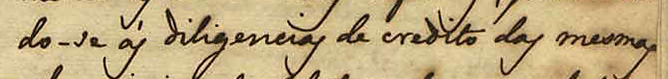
do-se ás diligencias de credito das mesmas
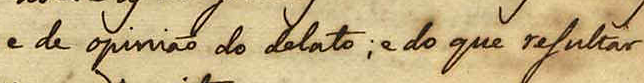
e de opiniaõ do delato; e do que resultar
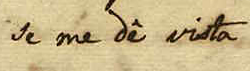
se me dê vista
